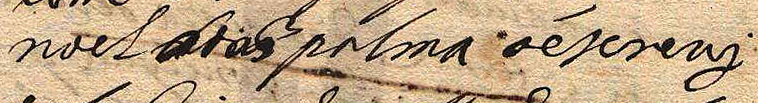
noel dias palma o escreuj
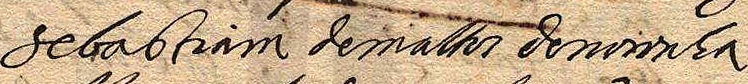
sebastiam de mattos de noronha
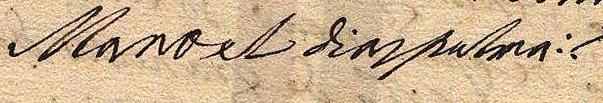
Manoel dias palma
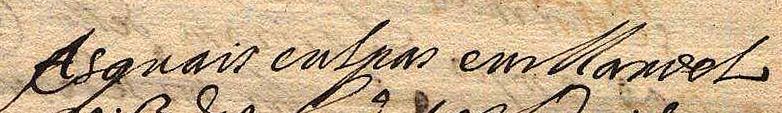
As quais culpas eu Manoel
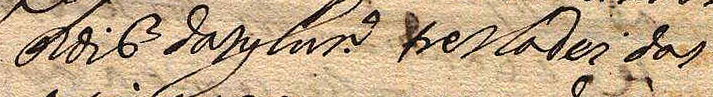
Rois̄ da sylur.a tresladei das
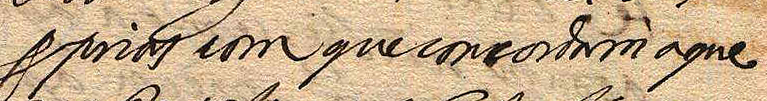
ꝓprias com que concordam a que
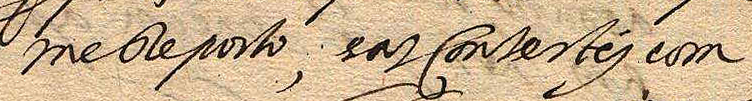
me Reporto, E as Contestej com
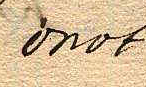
o not
